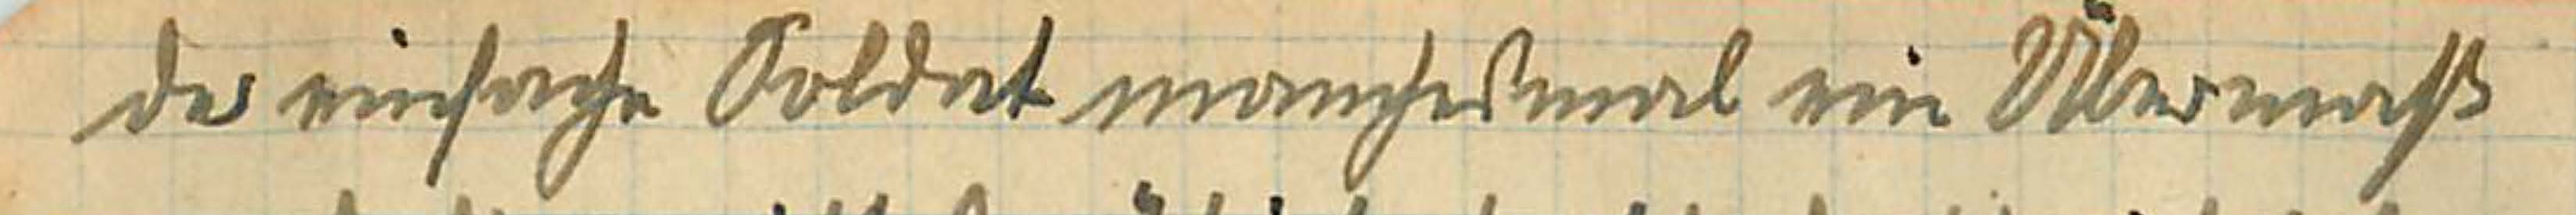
der einfache Soldat manchesmal ein Übermaß
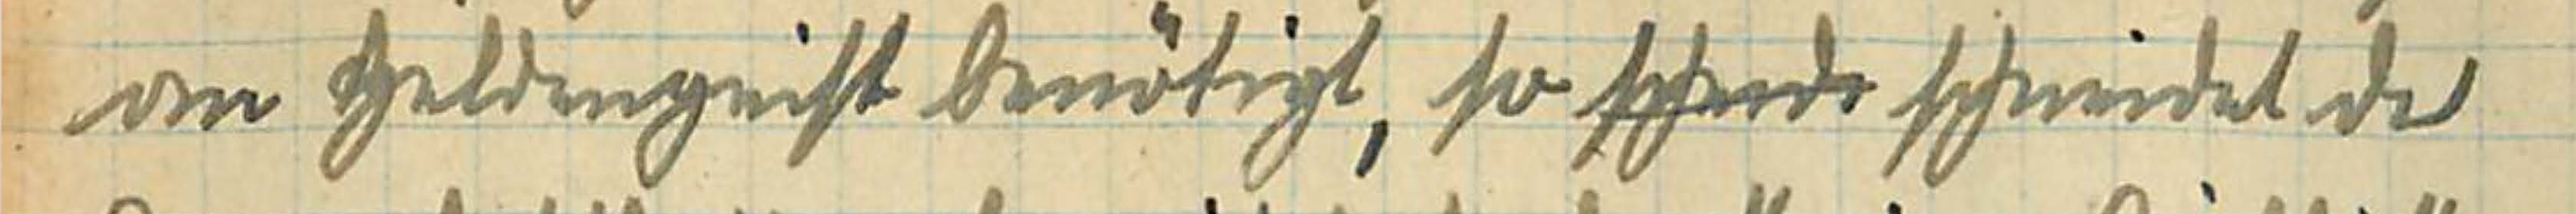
an Heldengeist benötigt, so scheide schneidet der
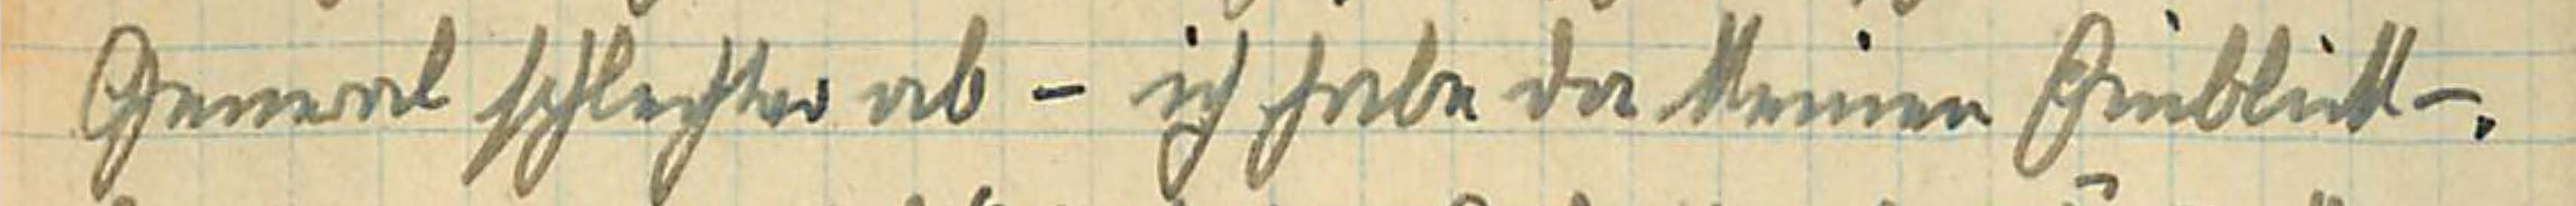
General schlechter ab – ich habe da keinen Einblick –.
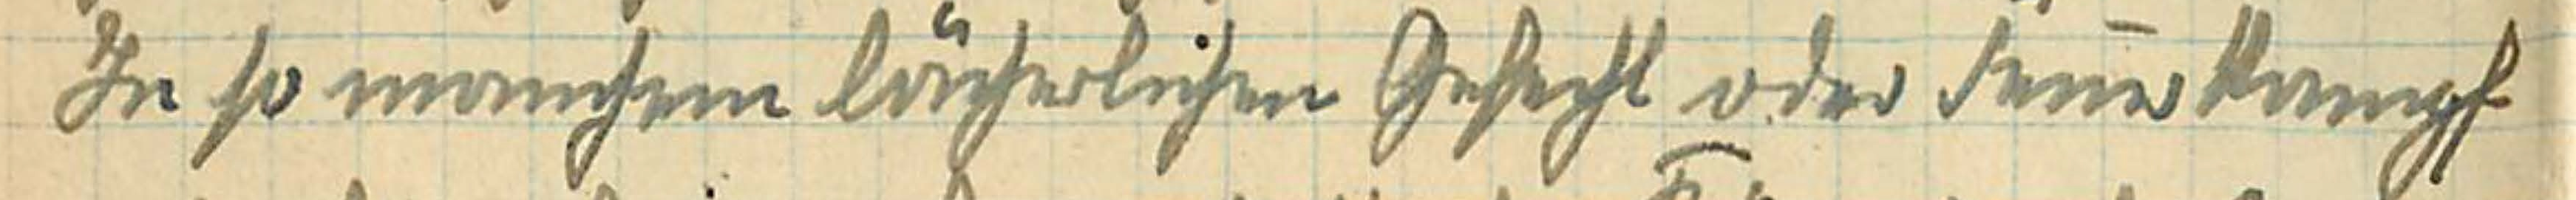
In so manchem lächerlichen Gefecht oder Feuerkampf
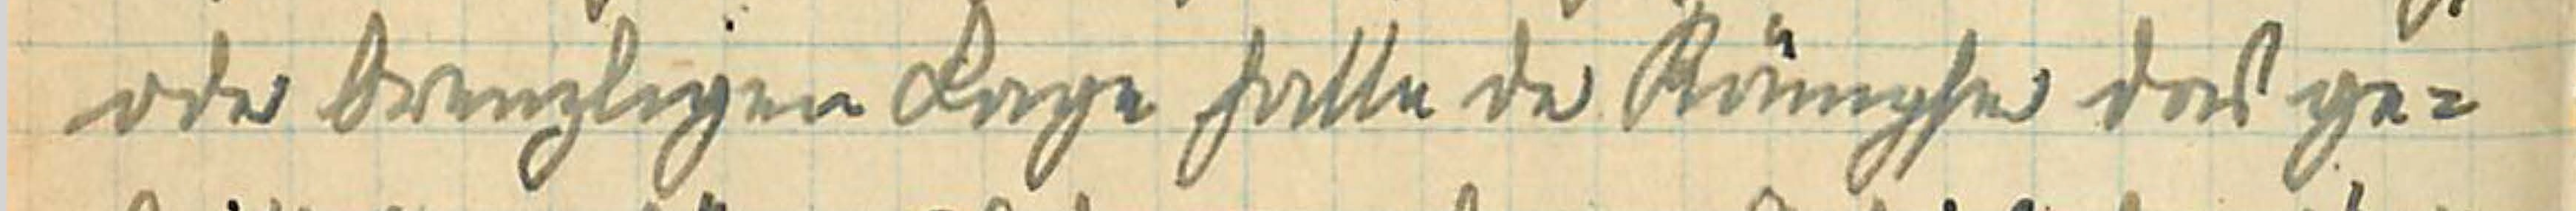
oder brenzligen Lage hatte der Kämpfer das ge-
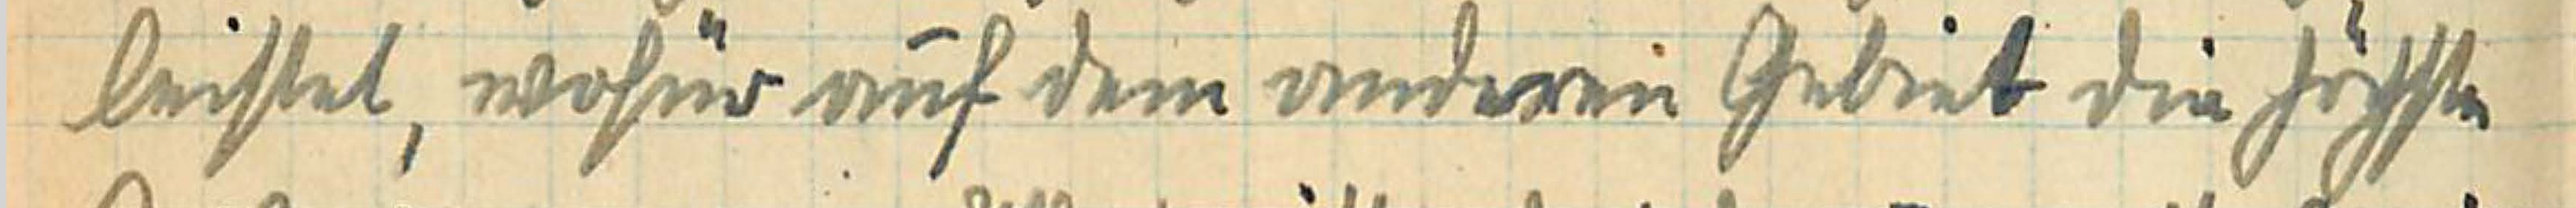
leistet, wofür auf dem anderen Gebiet die höchste
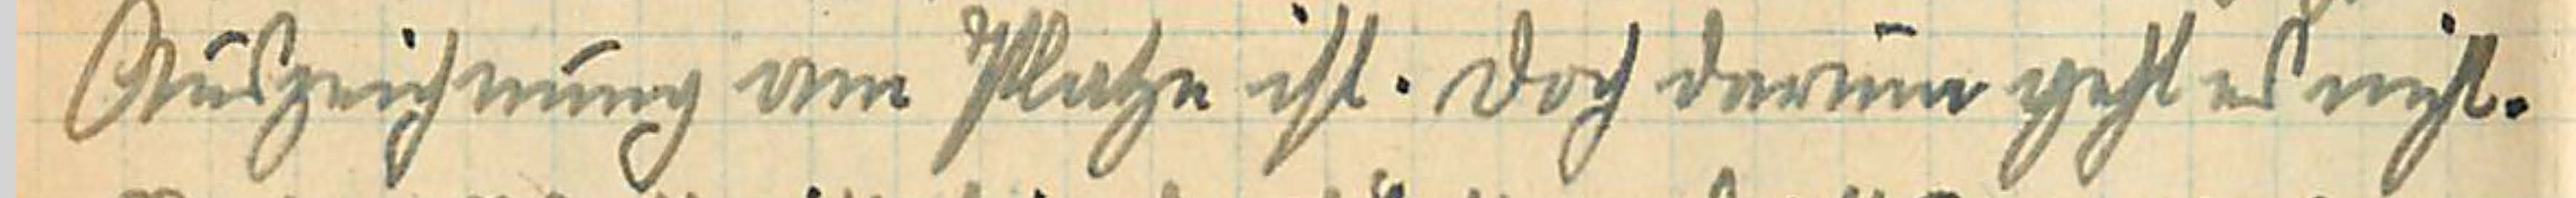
Auszeichnung am Platze ist. Doch darum geht es nicht.
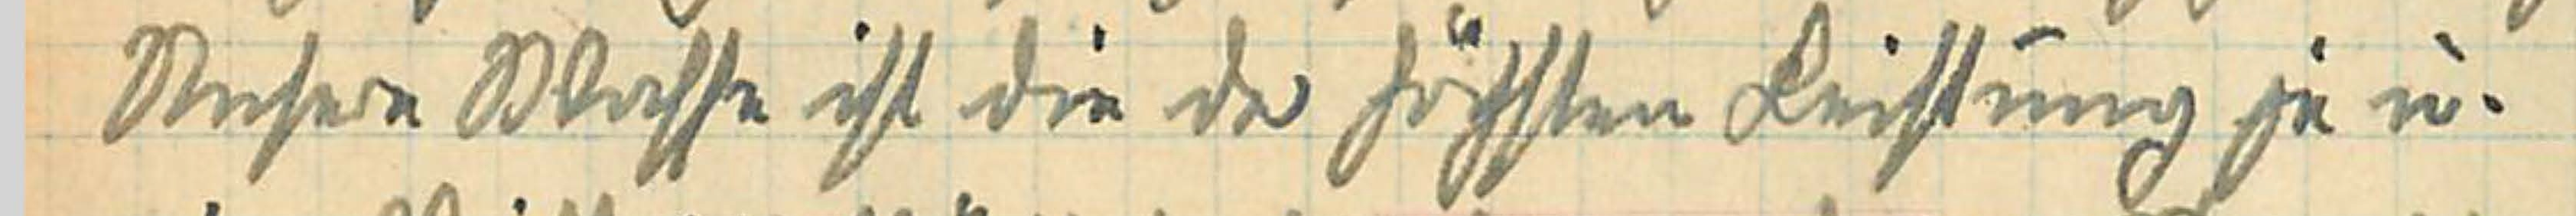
Unsere Waffe ist die der höchsten Leistung je u.
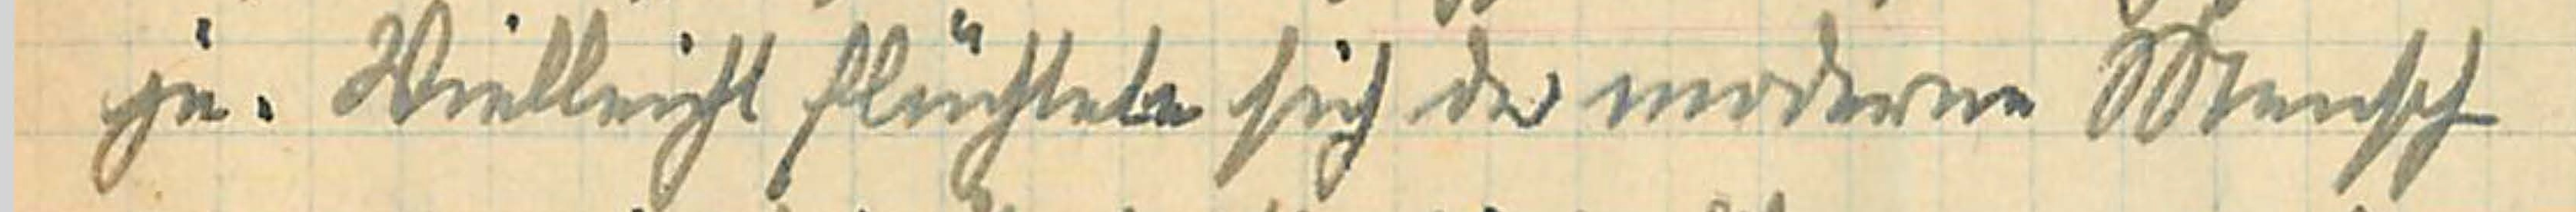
je. Vielleicht flüchtete sich der moderne Mensch
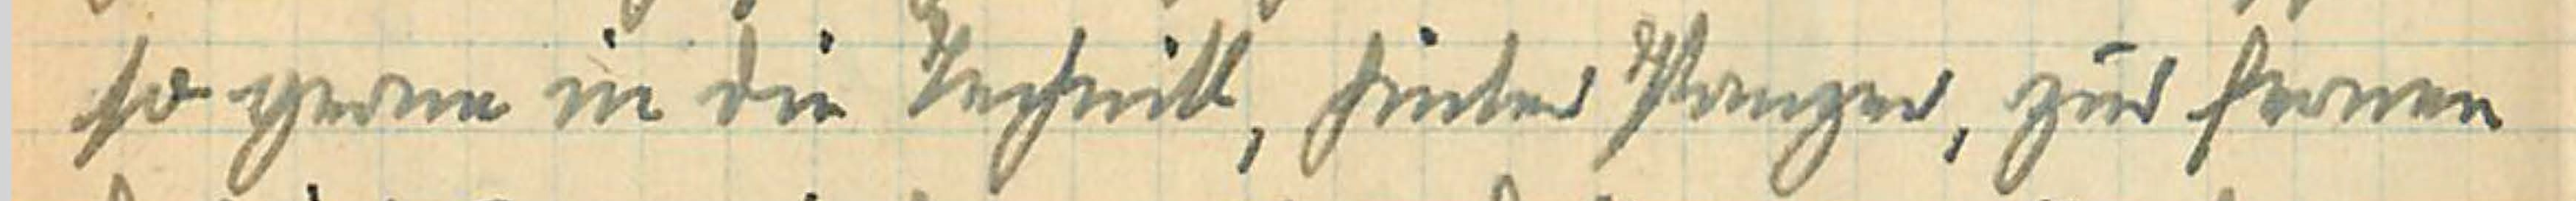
so gerne in die Technik, hinter Panzer, zur fernen
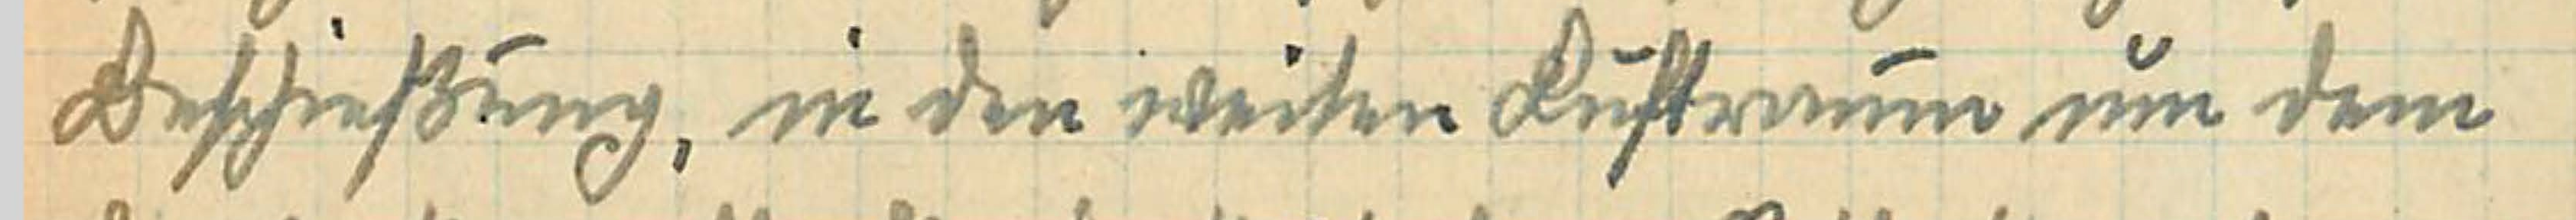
Beschießung, in den weiten Luftraum um dem
